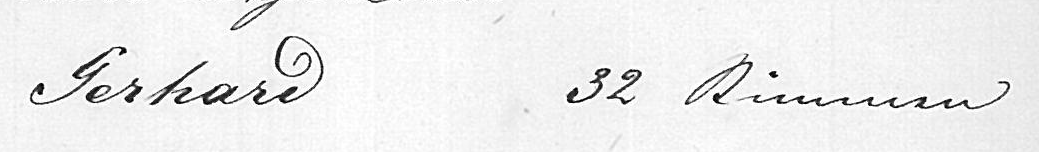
Gerhard 32 Stimmen
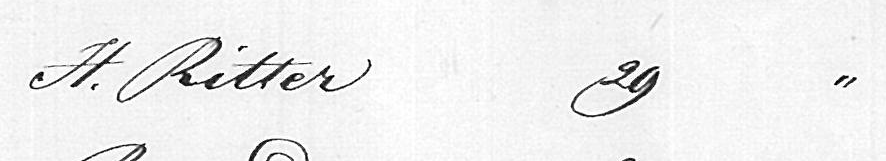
H. Ritter 29 "
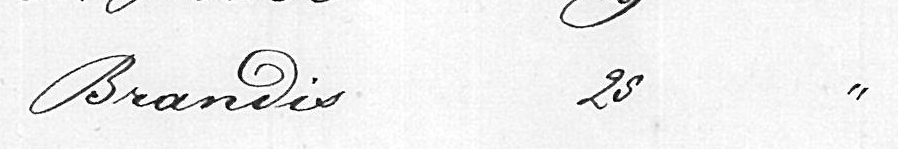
Brandis 25 "
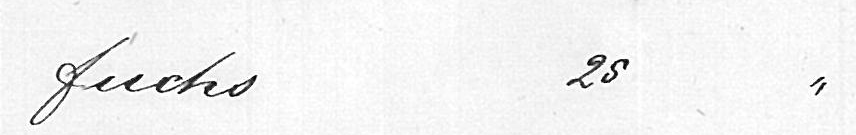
Fuchs 25 "
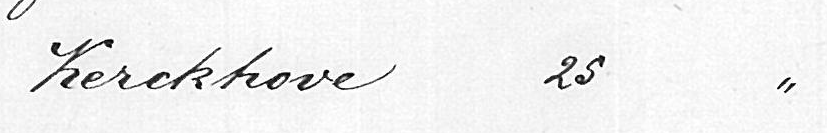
Kerckhove 25 "
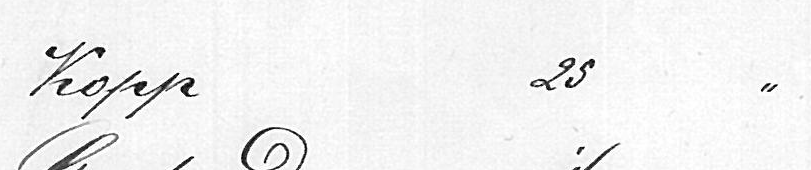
Kopp 25 "
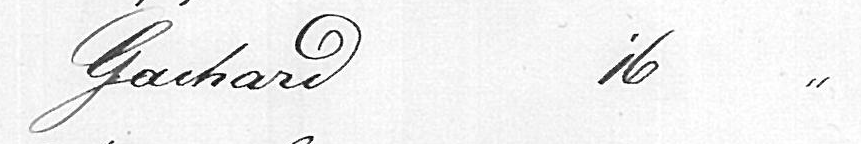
Gachard 16 "
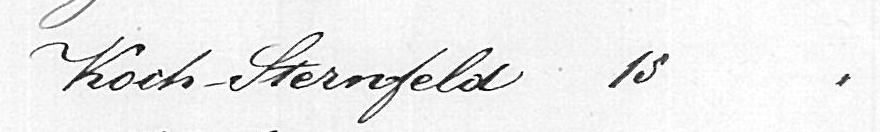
Koch-Sternfeld 15 "
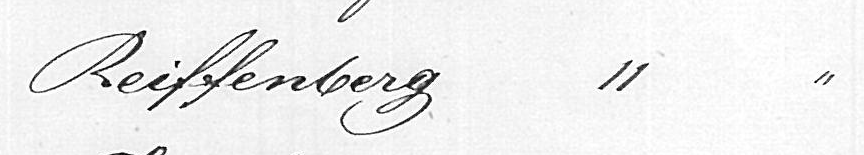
Reiffenberg 11 "
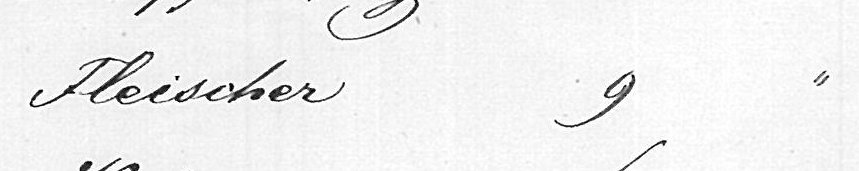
Fleischer 9 "
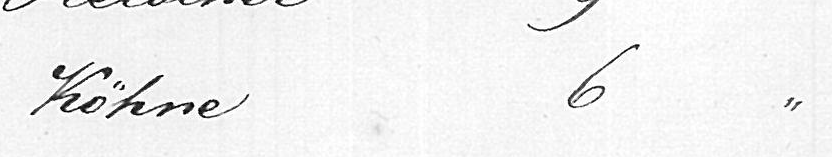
Köhne 6 "
